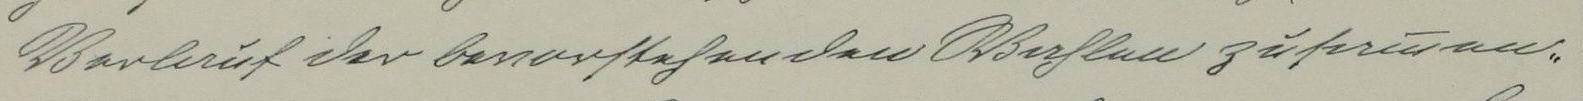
Verlauf der bevorstehenden Wahlen zusammen-
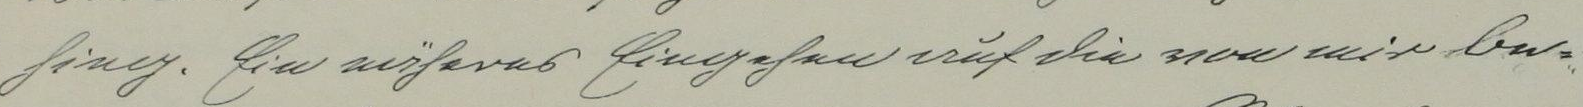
hing. Ein näheres Eingehen auf die von mir be-
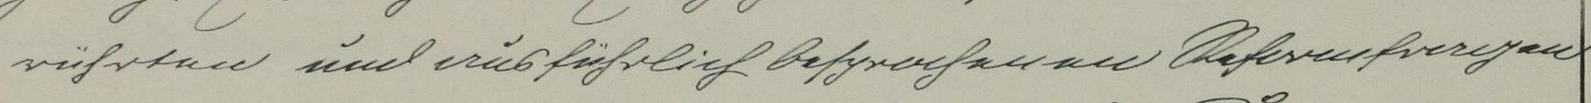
rührten und ausführlich besprochenen Reformfragen
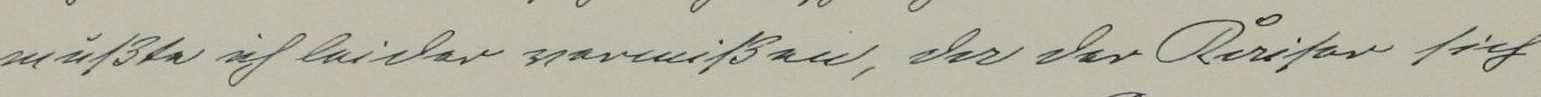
mußte ich leider vermißen, da der Kaiser sich
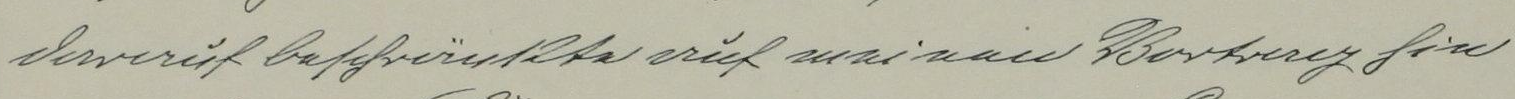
darauf beschränkte, auf meinen Vortrag hin
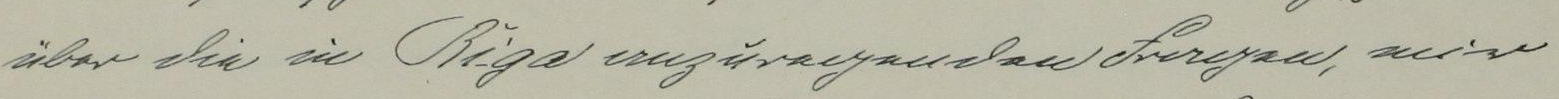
über die in Riga anzuregenden Fragen, mir
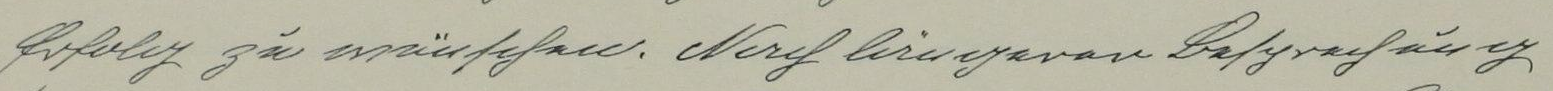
Erfolg zu wünschen. Nach längerer Besprechung
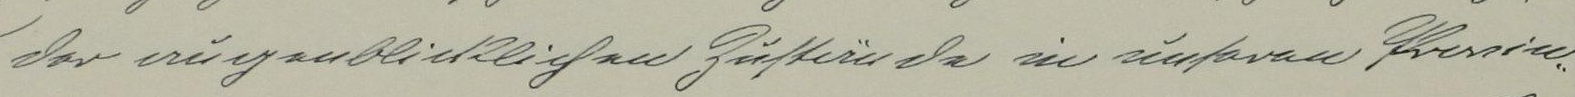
der augenblicklichen Zustände in unseren Provin-
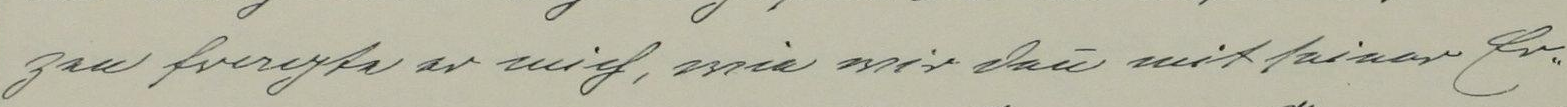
zen fragte er mich, wie wir denn mit seiner Er-
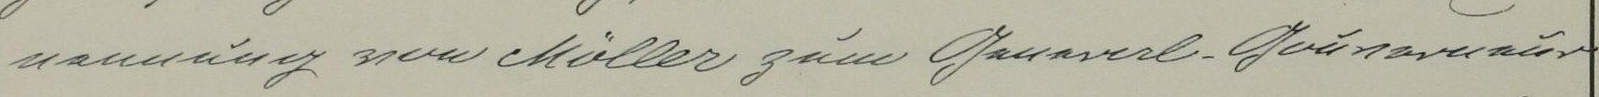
nennung von Möller zum General-Gouverneur
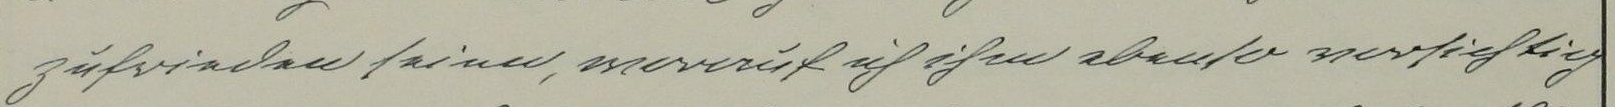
zufrieden seien, worauf ich ihm ebenso vorsichtig
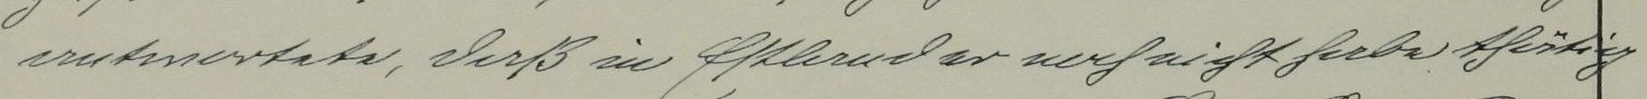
antwortete, daß in Estland er noch nicht habe thätig
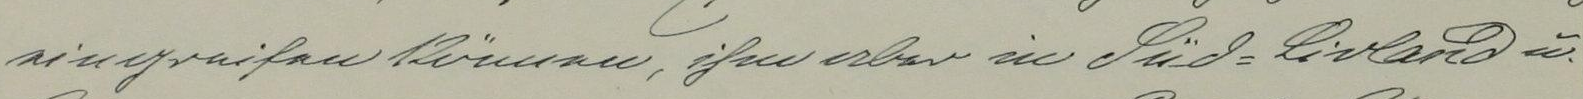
eingreifen können, ihm aber in Süd-Livland u.
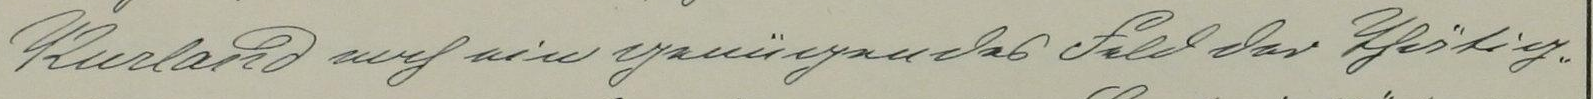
Kurland noch ein genügendes Feld der Thätig-
